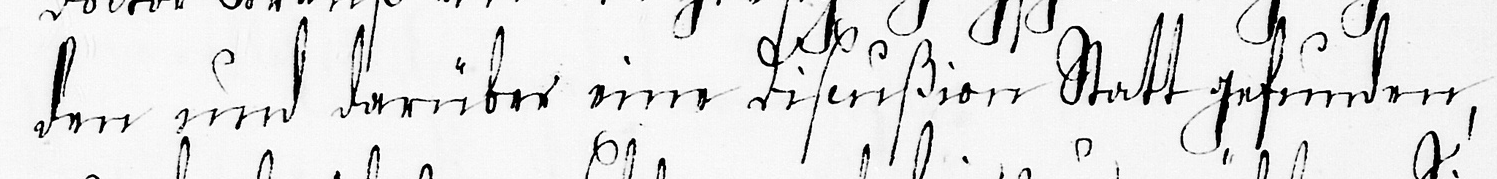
den und darüber eine Discußion Statt gefunden,
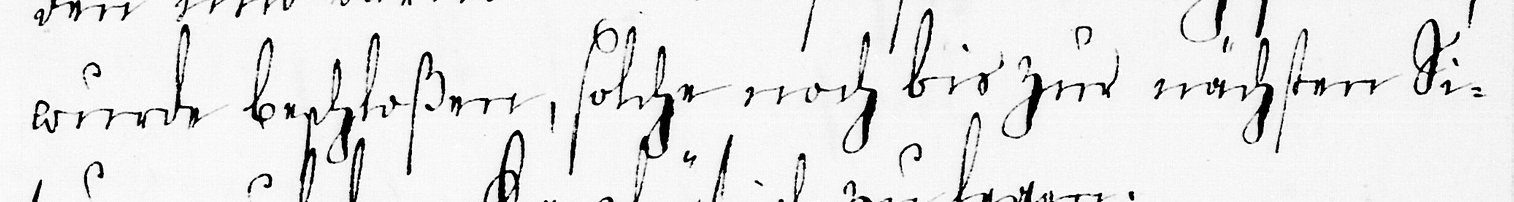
wurde beschloßen, solche noch bis zur nächsten Si¬
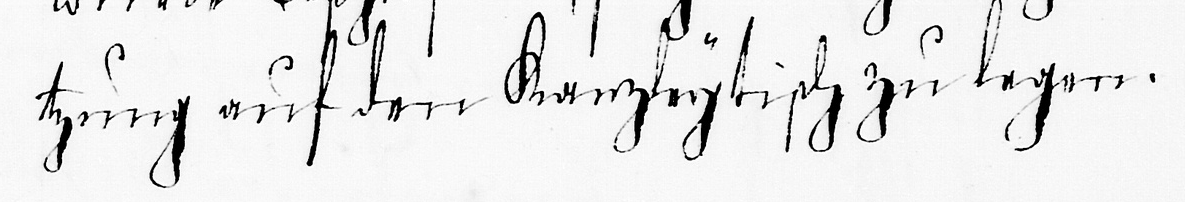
tzung auf den Kanzleytisch zu legen.
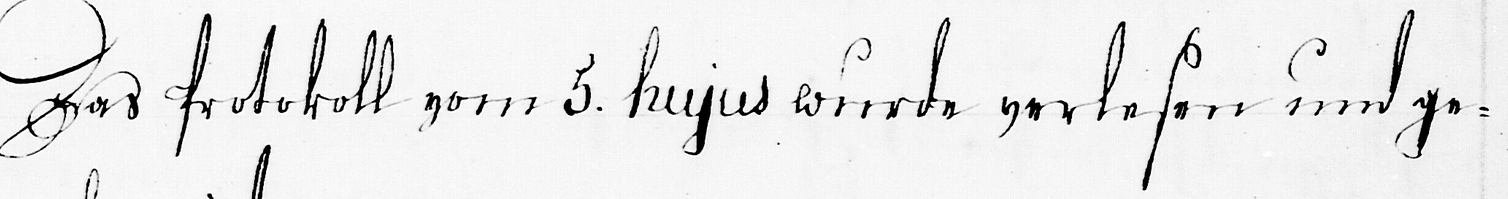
Das Protokoll vom 5. hujus wurde verlesen und ge¬
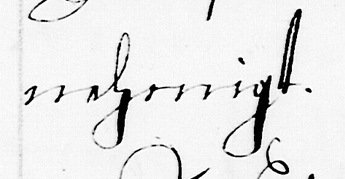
nehmigt.
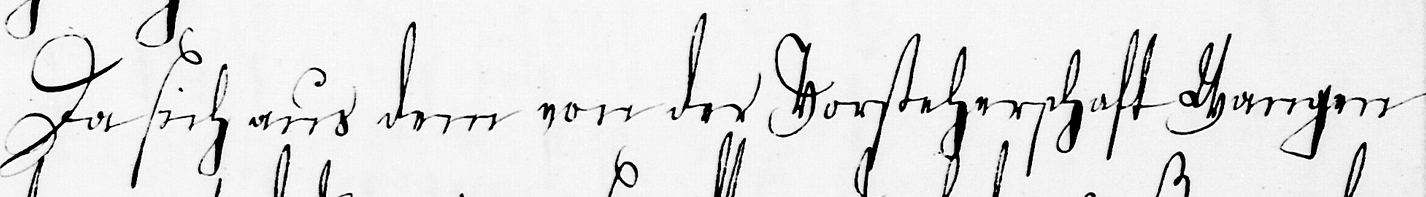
Da sich aus dem von der Vorsteherschaft Wangen
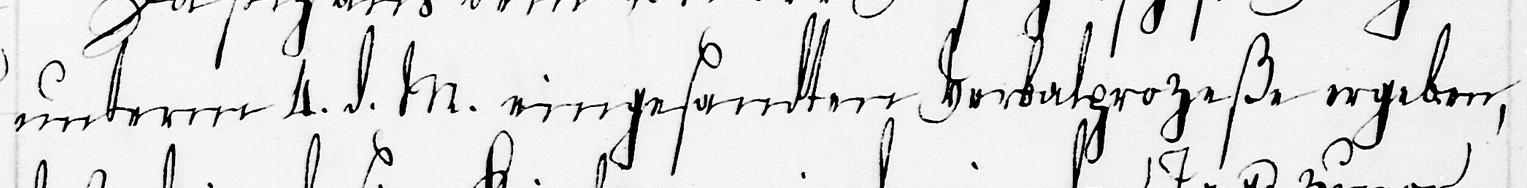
untern 4. d. M. eingesandten Verbalprozeße ergeben,
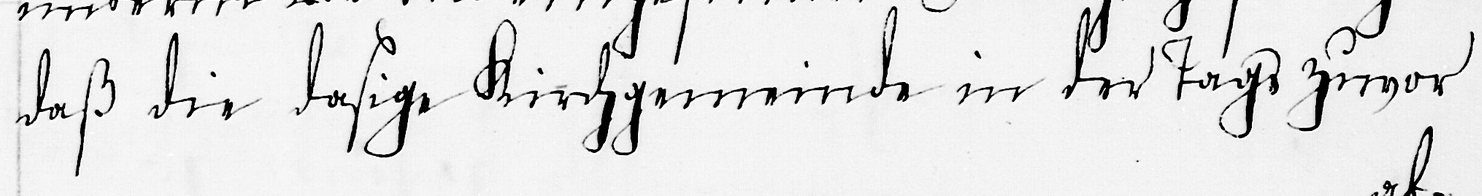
daß die dasige Kirchgemeinde in der Tags zuvor
